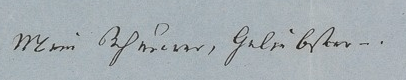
Mein Theurer, Geliebster –.
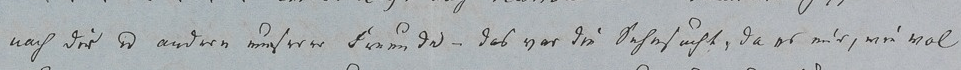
nach dir & anderen unserer Freunde – das war die Sehnsucht, da es mir, wie wol
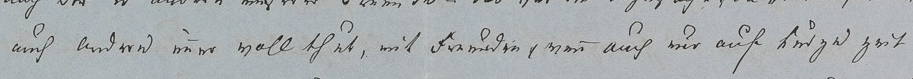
auch andern immer wohl thut, mit Freunden, wenn auch nur auf kurze Zeit
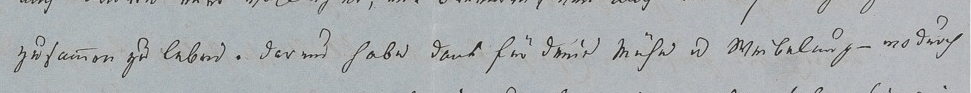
zusammen zu leben. Darum habe Dank für diese Mühe & Weibelung – wodurch
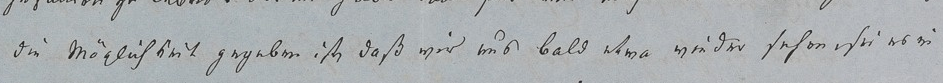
die Möglichkeit gegeben ist daß wir uns bald etwa wieder sehen, sei es in
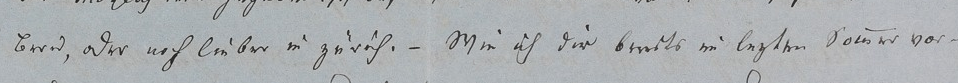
Bern, oder noch lieber in Zürich. – Wie ich dir bereits im lezten Sommer vor-
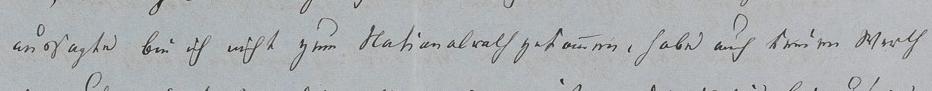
aussagte bin ich nicht zum Nationalrath gekommen, habe auch keinen Werth
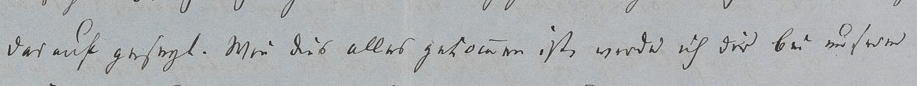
darauf gesezt. Wie dies alles gekommen ist, werde ich Dir bei unserm
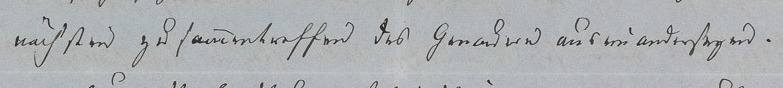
nächsten Zusammentreffen des Genauern auseinandersezen.
